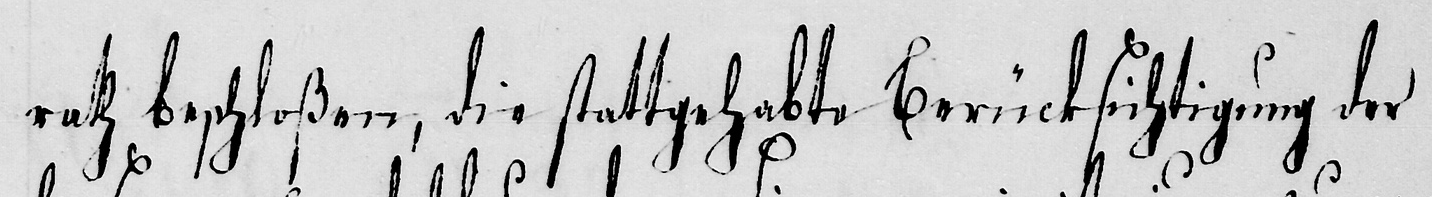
ath, beschloßen, die stattgehabte Berücksichtigung der
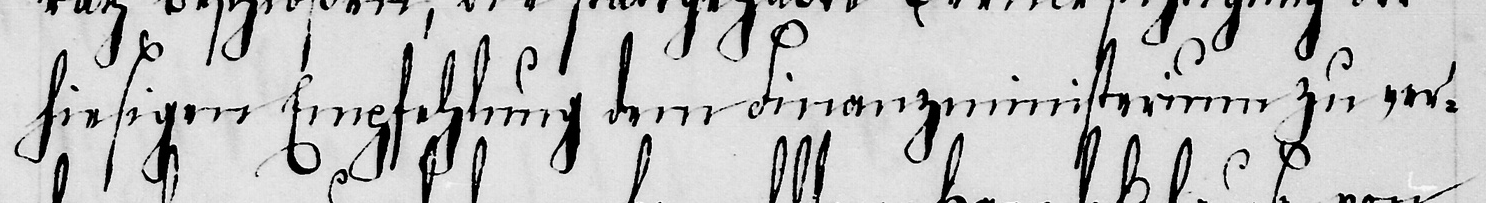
hiesigen Empfehlung dem Finanzministerium zu ver¬
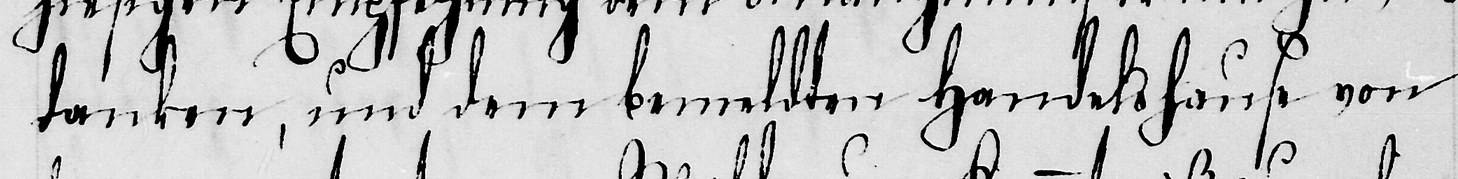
danken, und dem bemeldten Handelshause von
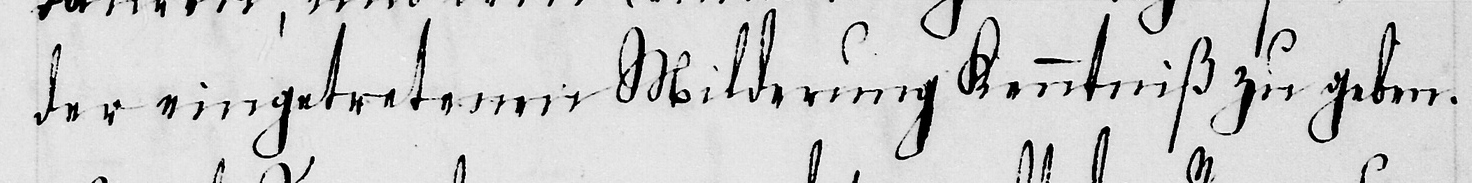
der eingetretenen Milderung Kenntniß zu geben.
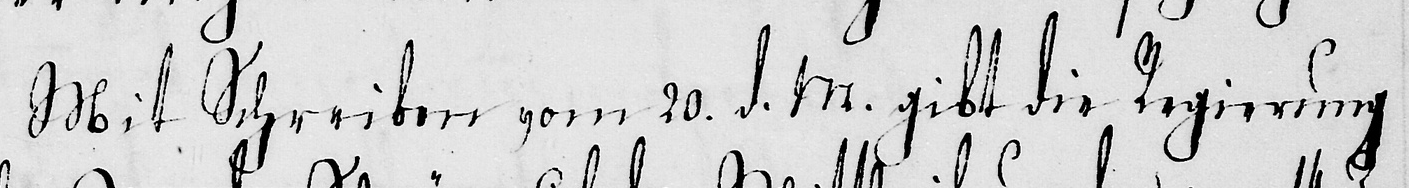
Mit Schreiben vom 20. d. M. gibt die Regierung
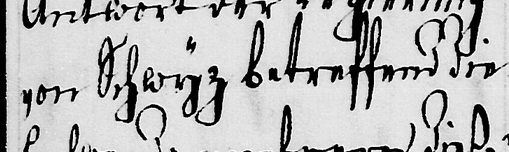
en, wohl aber die
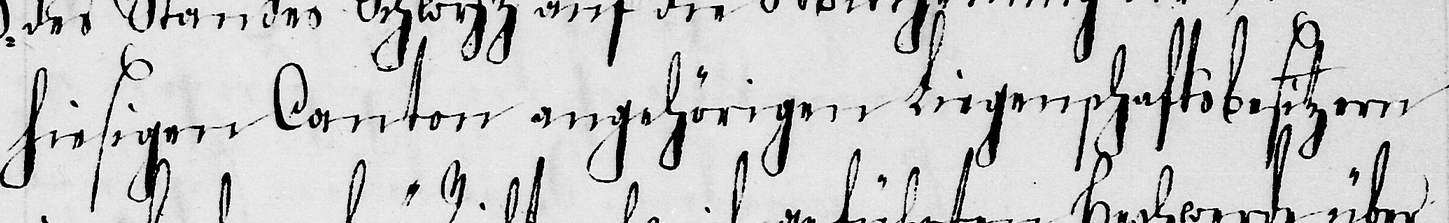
hiesigen Canton angehörigen Liegenschaftsbesitze¬
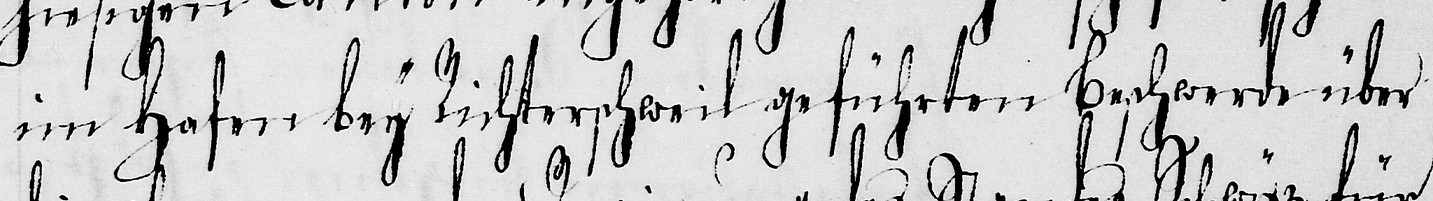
im Hafen bey Richterschweil geführten Beschwerde über
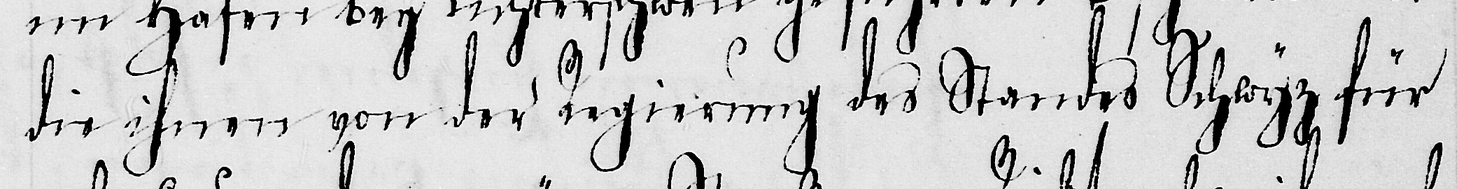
die ihnen von der Regierung des Standes Schwyz für
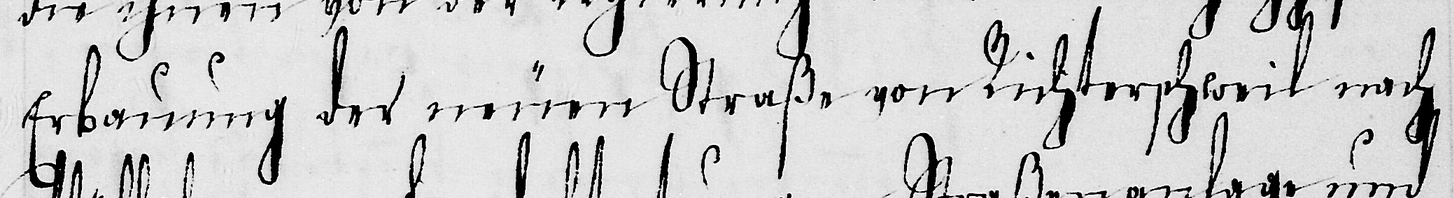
Erbauung der neuen Straße von Richterschweil nach
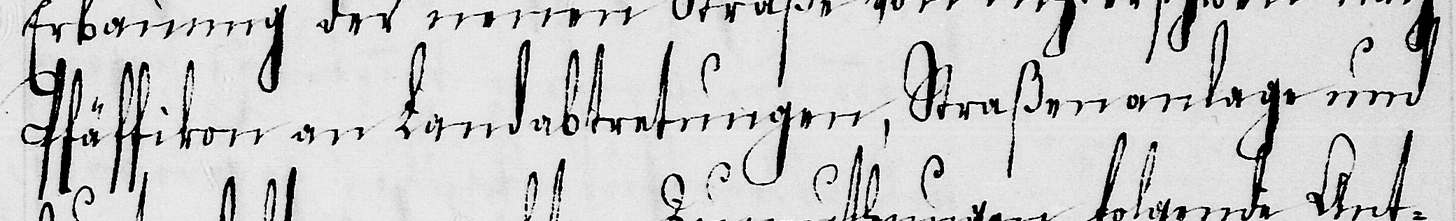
Pfäffikon an Landabtretungen, Straßenanlage und
